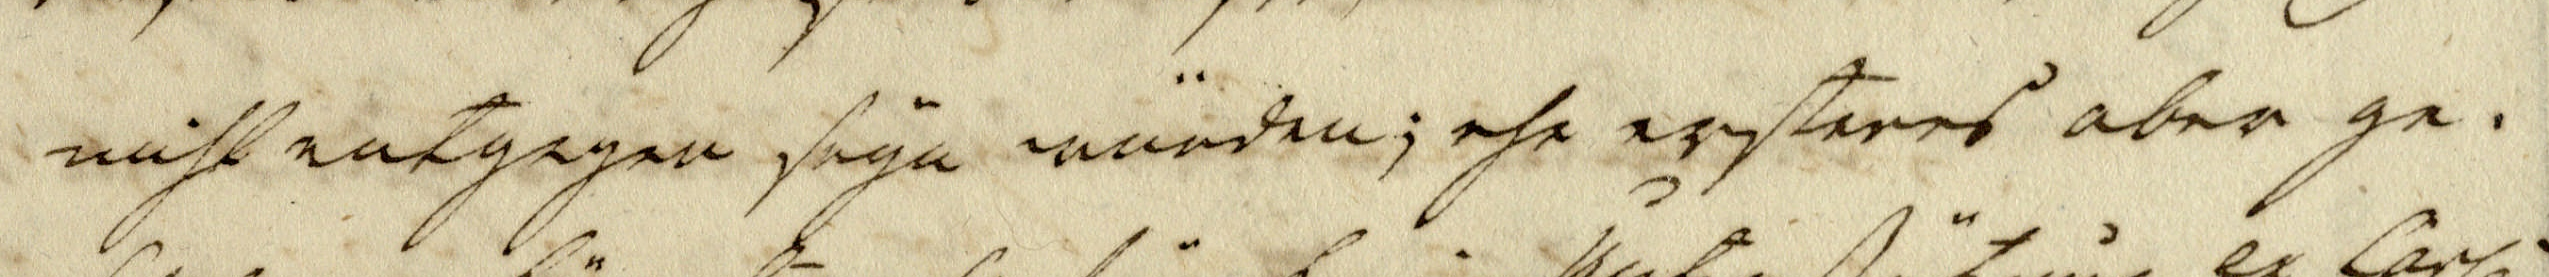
nicht entgegen seÿn würden; ehe ersteres aber ge¬
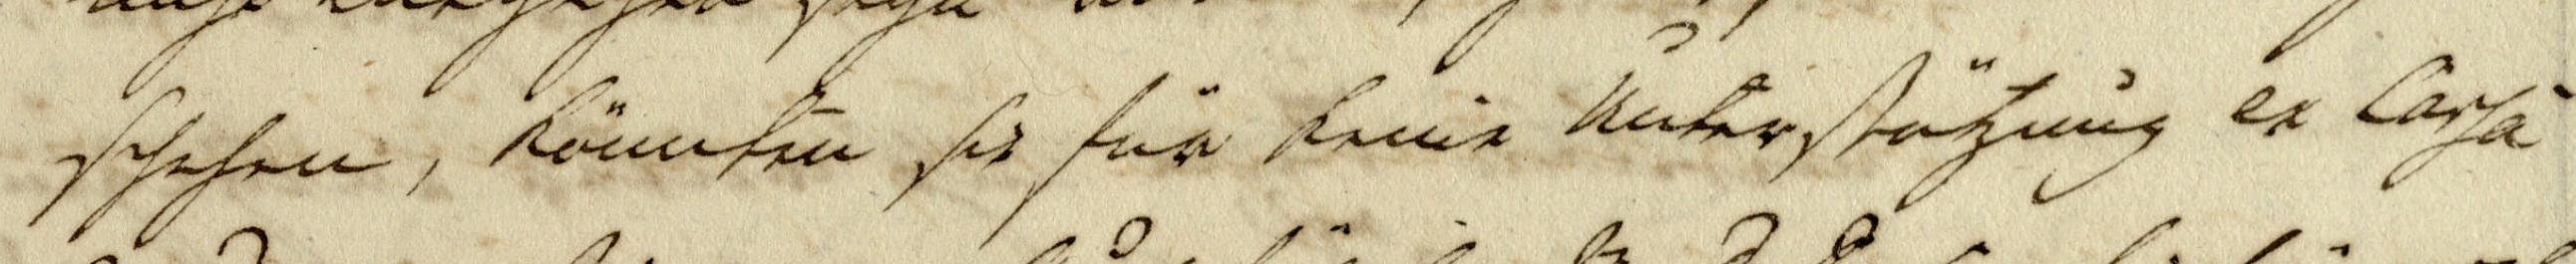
schehen, könnten sie für keine Unterstützung ex Cassa
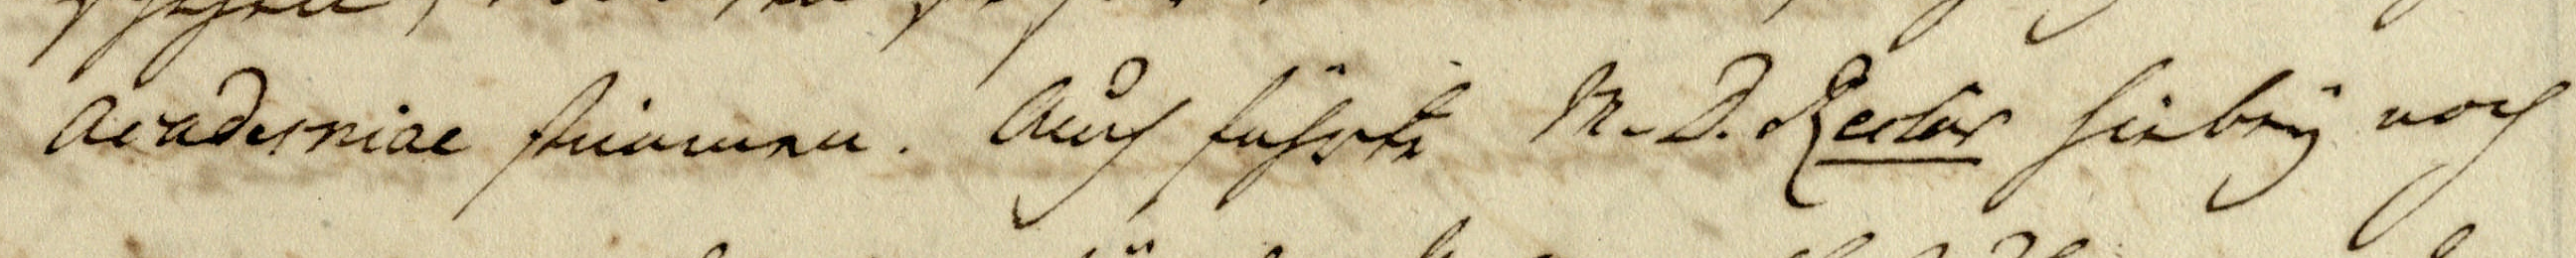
Academiae stimmen. Auch führte M. D. Rector hiebeÿ noch
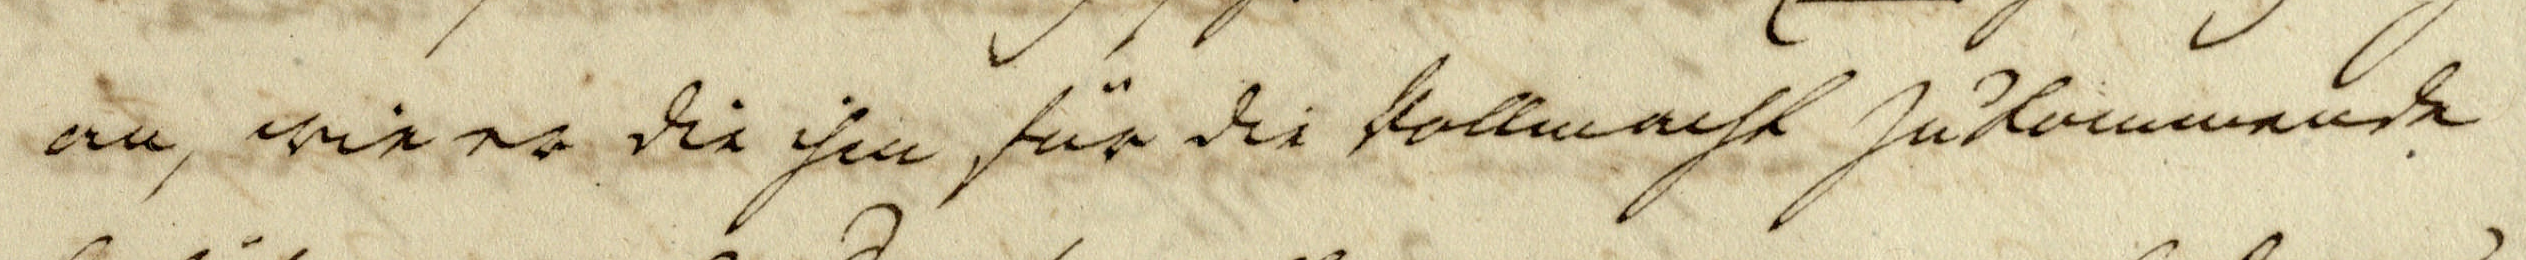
an, wie er die ihm für die Vollmacht zukommende
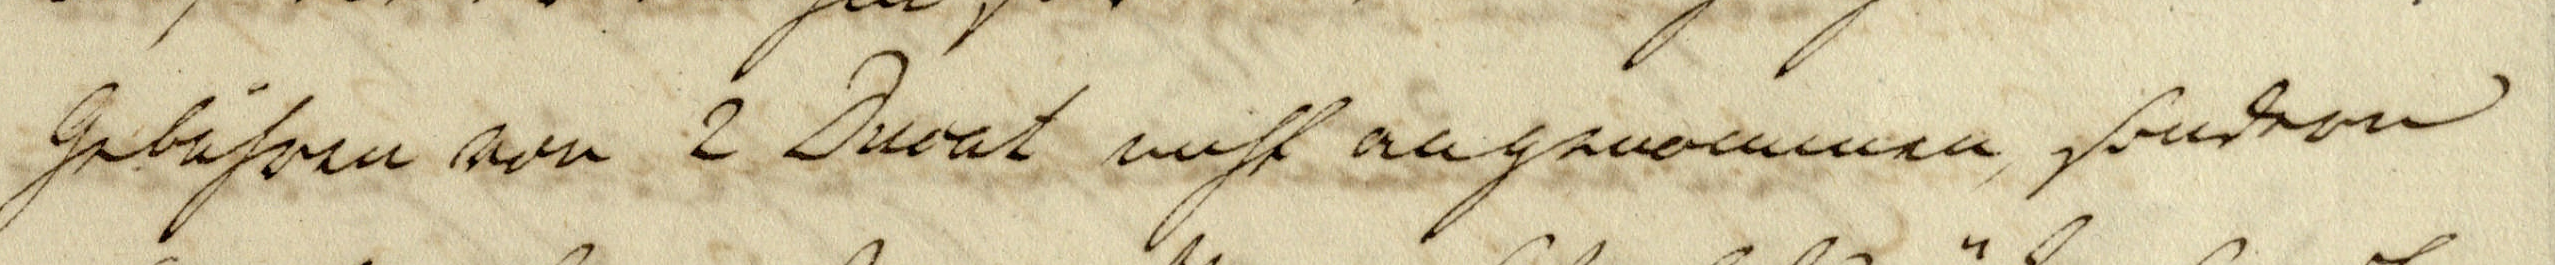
Gebühren von 2 Ducat nicht angenommen, sondern
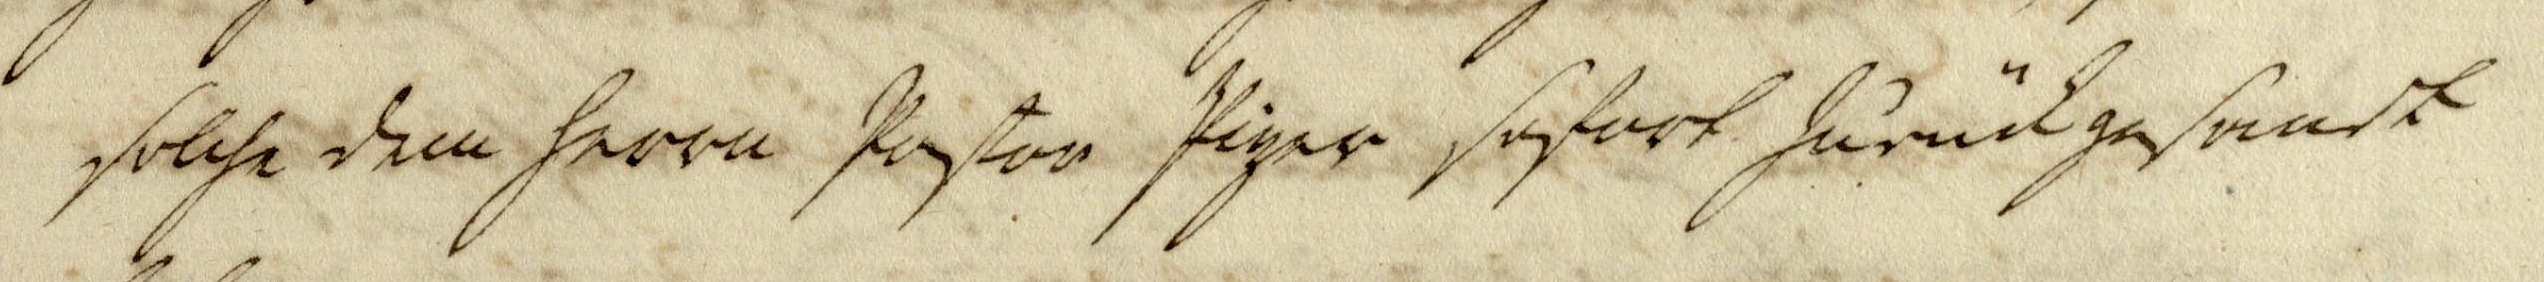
solche dem Herrn Pastor Piper sofort zurückgesandt
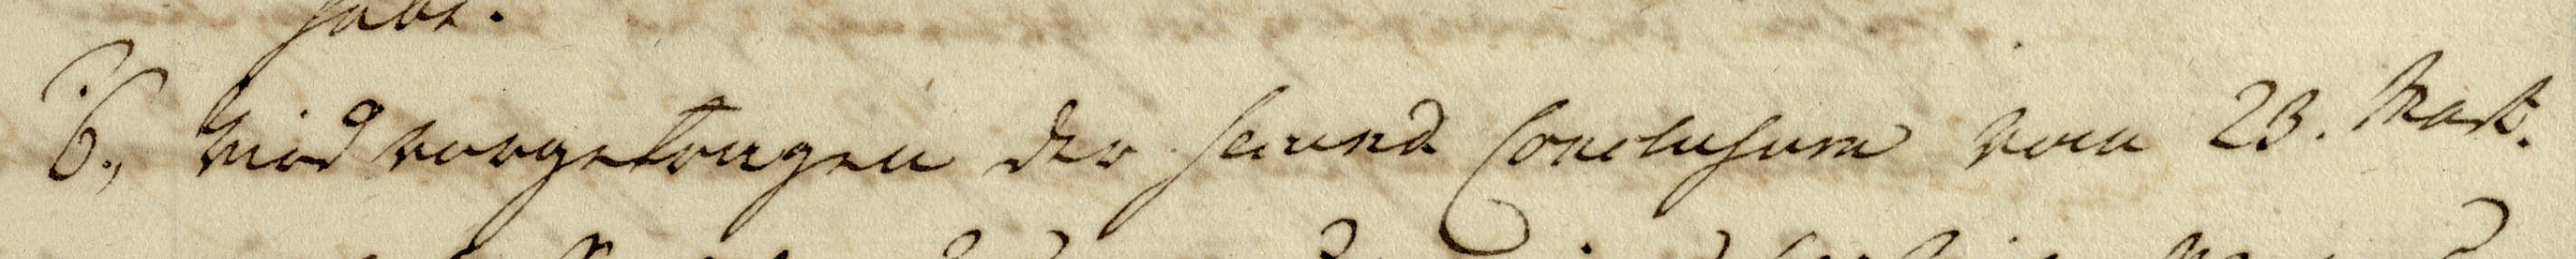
6., und vorgetragen der secund. Conclusum vom 23. Mart.
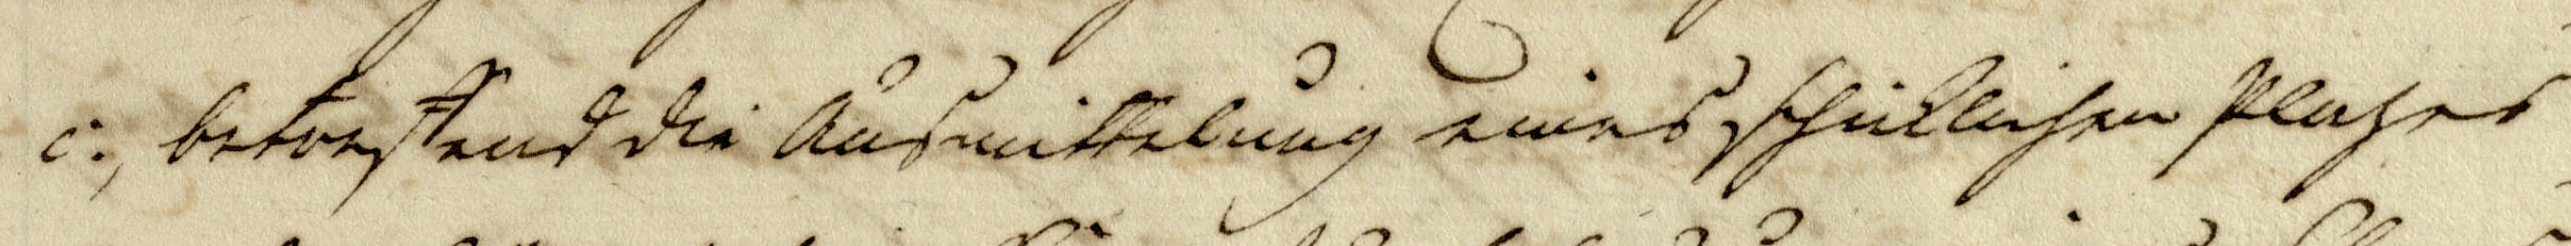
c., betreffend die Ausmittelung eines schicklichen Plazes
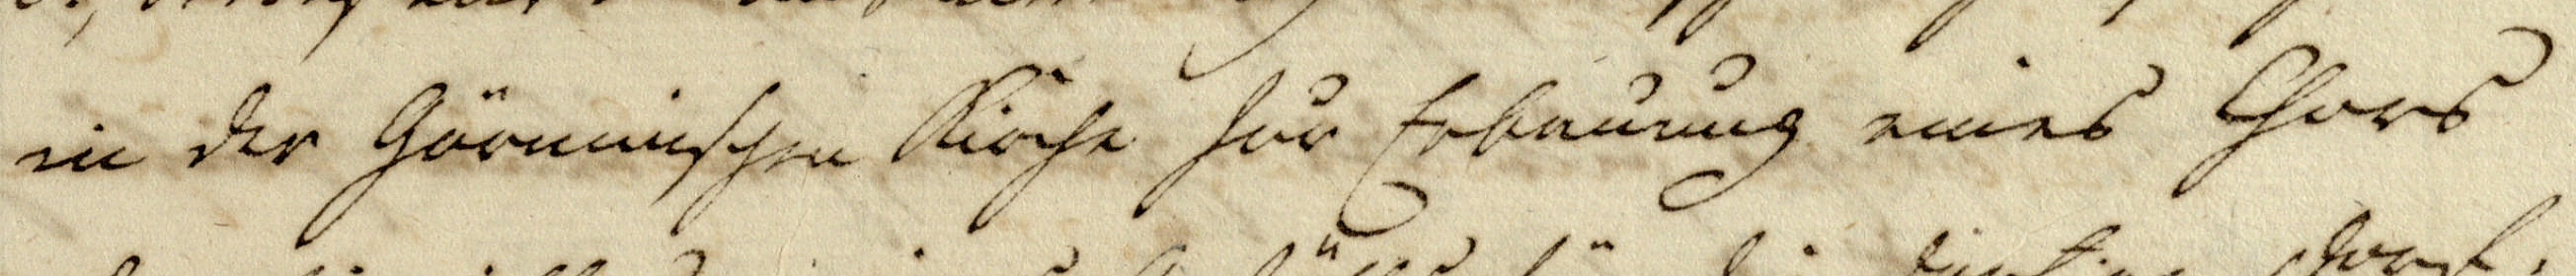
in der Görminschen Kirche zur Erbauung eines Chors
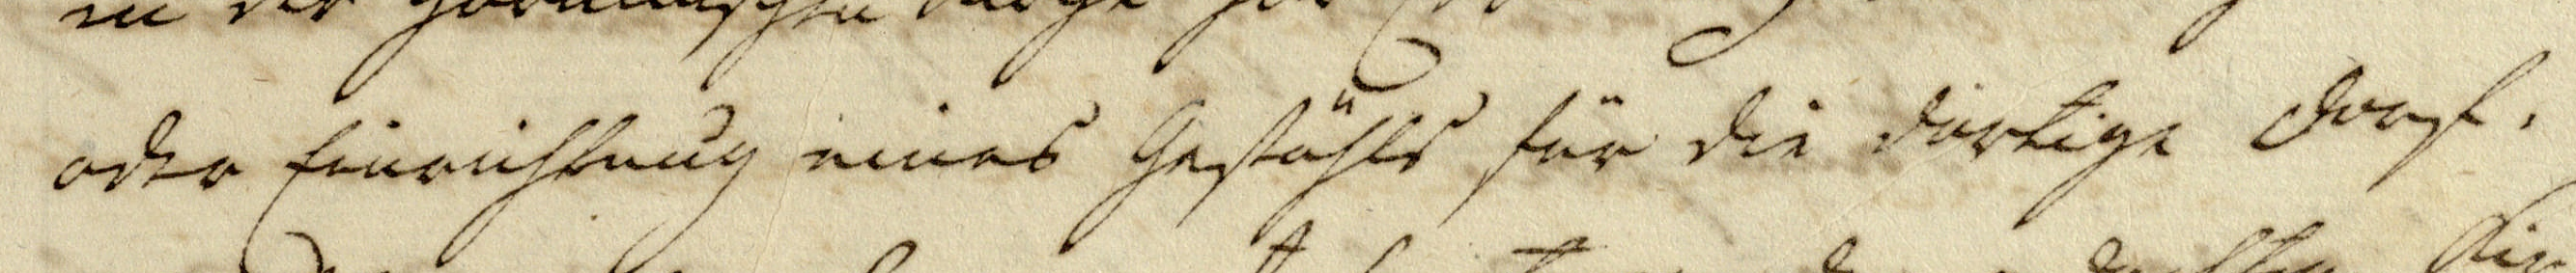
oder Einrichtung eines Gestühls für die dortige Dorf¬
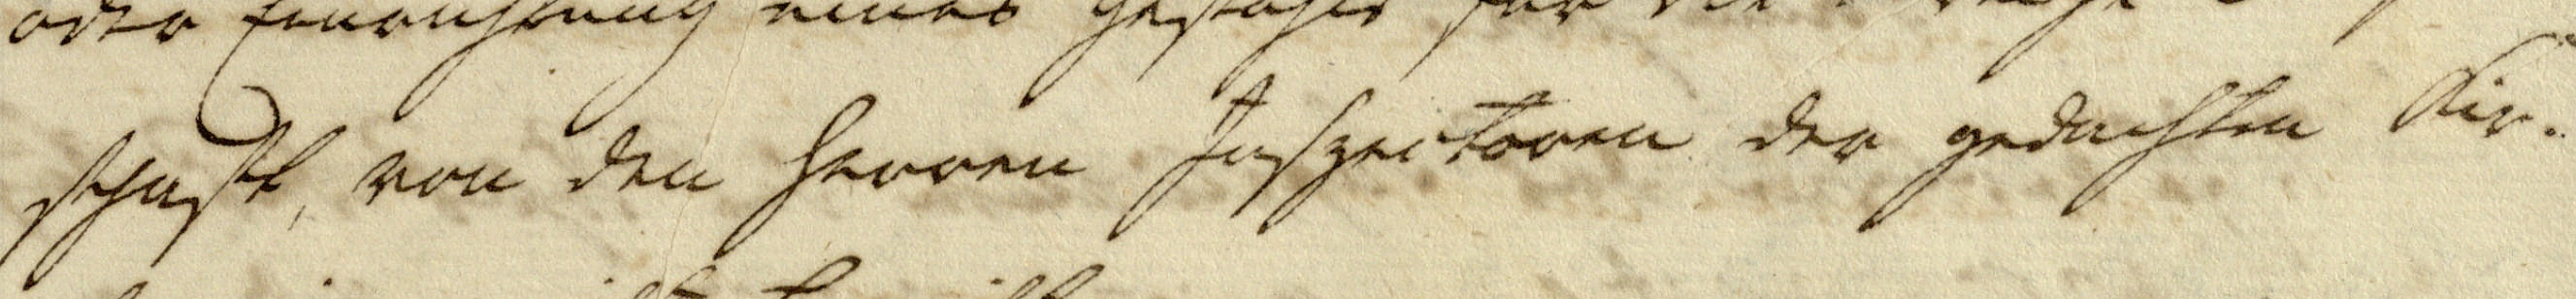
schaft von den Herren Inspectoren der gedachten Kir¬
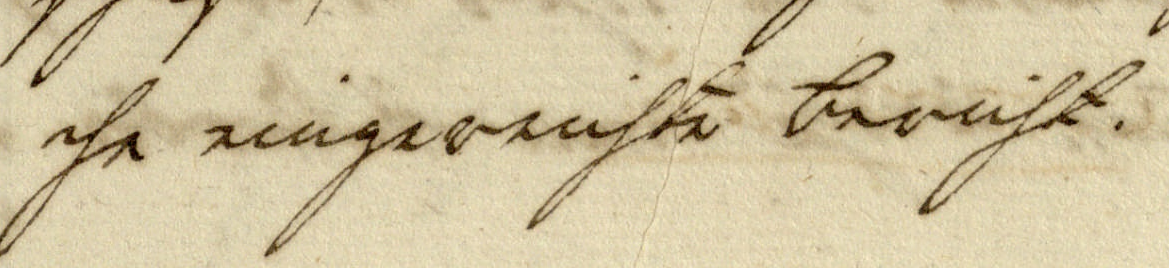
che eingereichte Bericht.
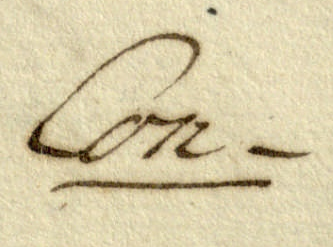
Con¬
